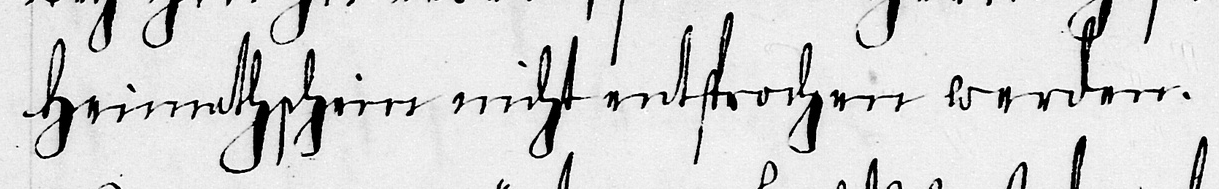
Heimathschein nicht entsprochen werden.
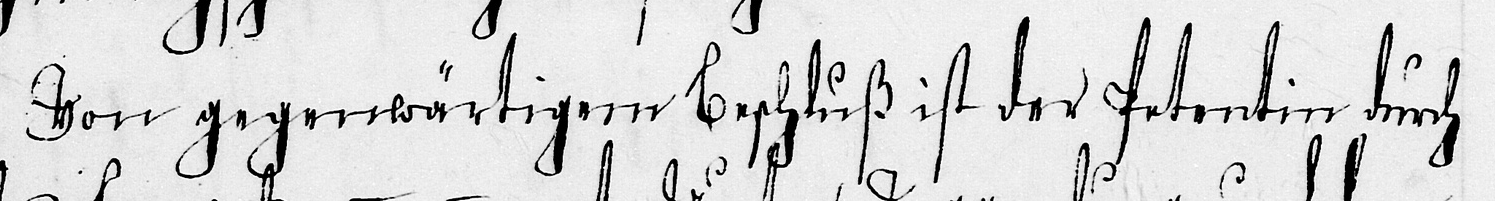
Von gegenwärtigem Beschluß ist der Petentin durch
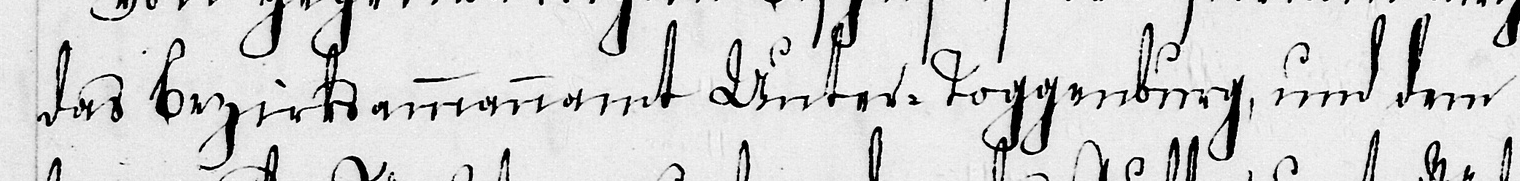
das Bezirksammannamt Unter-Toggenburg, und dem
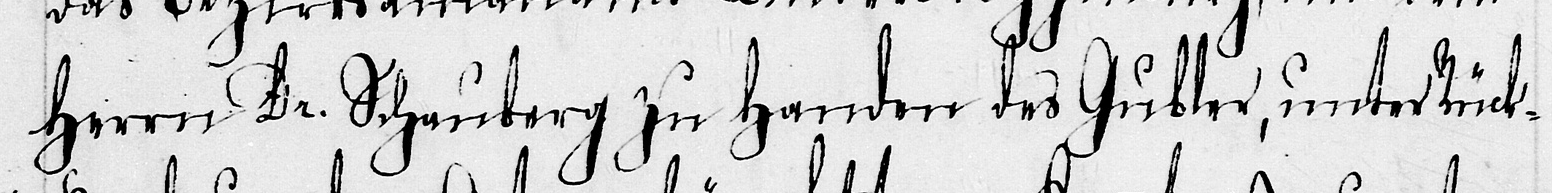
Herrn Dr. Schauberg zu Handen des Gubler, unter Rück¬
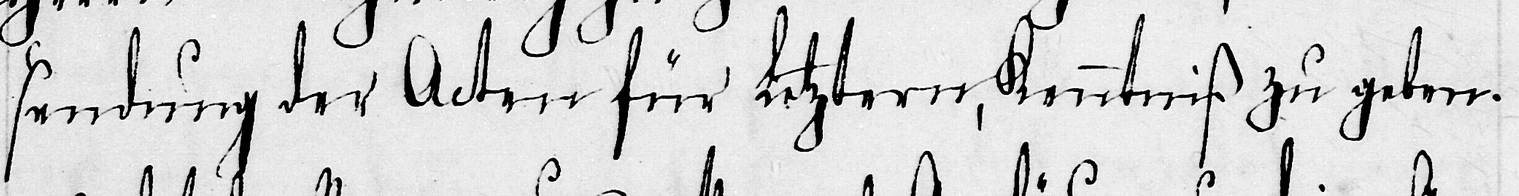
sendung der Acten für Letztern, Kenntniß zu geben.
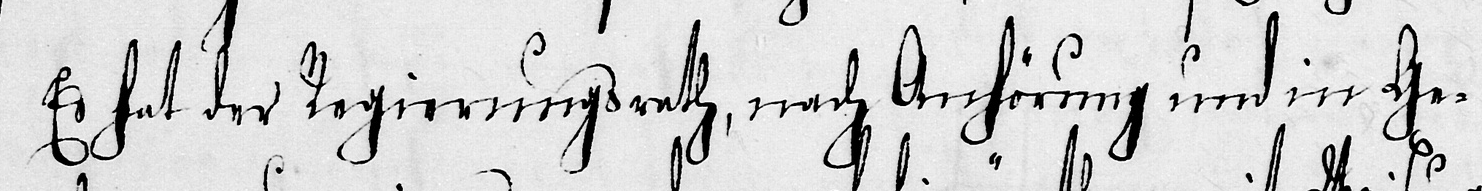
Es hat der Regierungsrath, nach Anhörung und in Ge¬
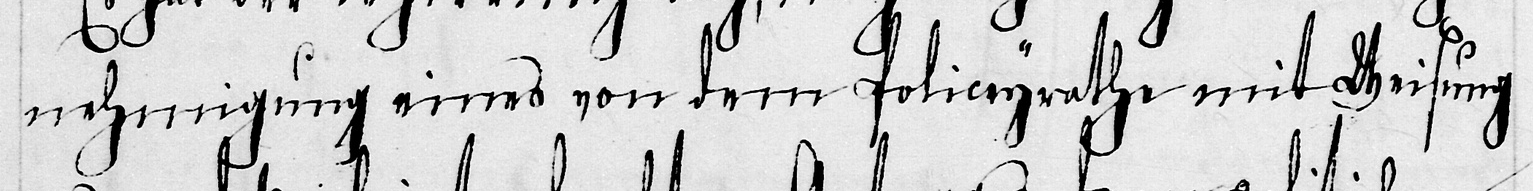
nehmigung eines von dem Policeyrathe mit Weisung
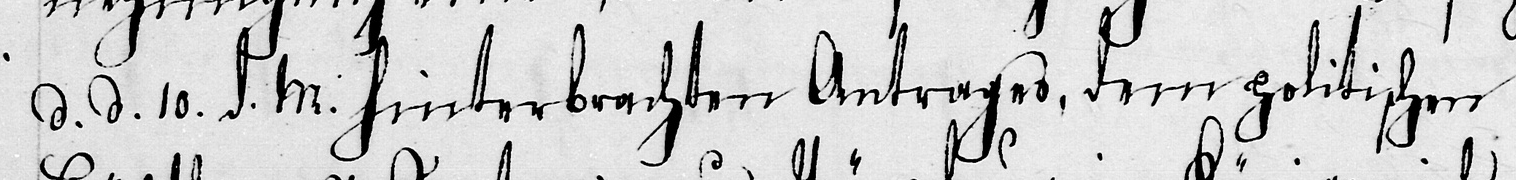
d. d. 10. d. M. hinterbrachten Antrages, dem politischen
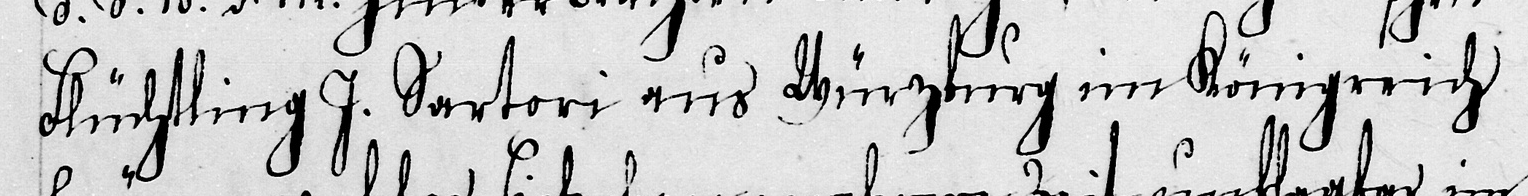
Flüchtling J. Sartori aus Würzburg m Königreich
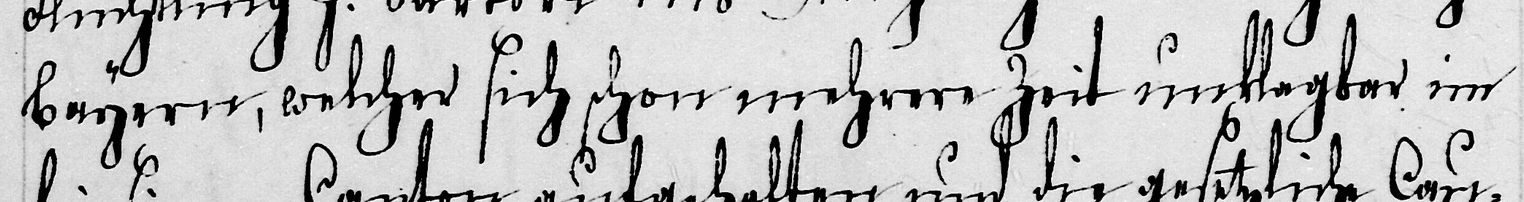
Bayern, welcher sich schon mehrere Zeit unklagbar im
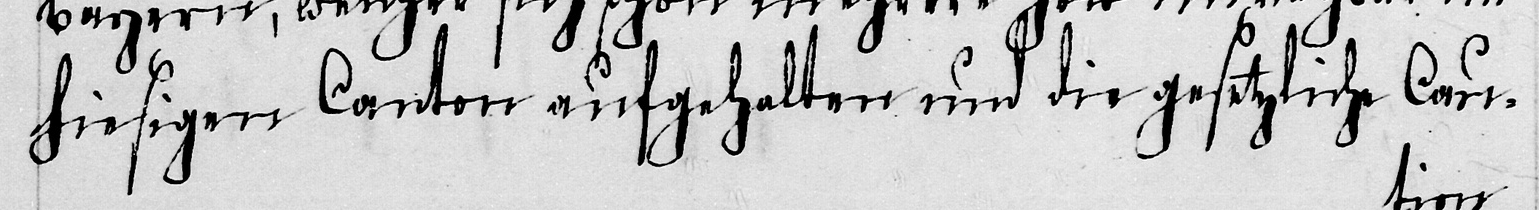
hiesigen Canton aufgehalten und die gesetzliche Cau-
